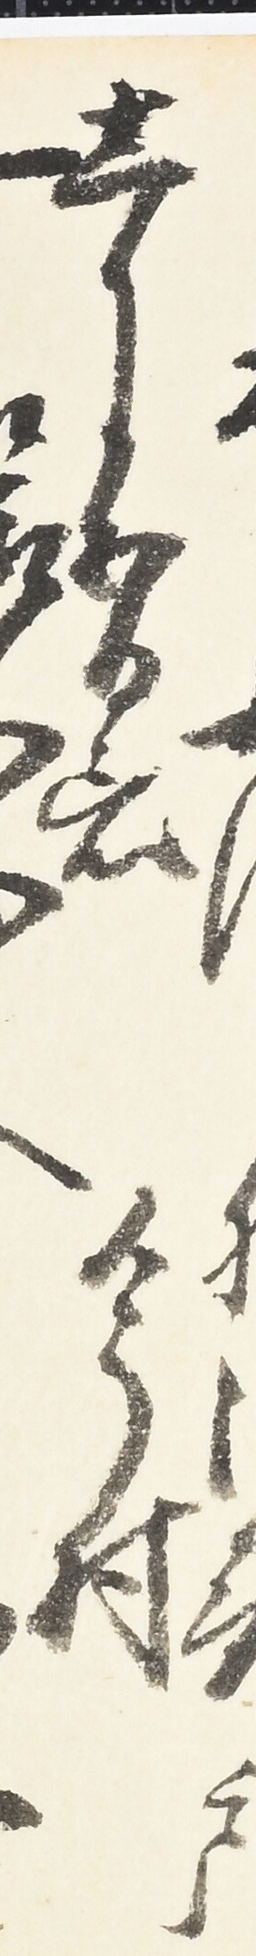十二月五日今村
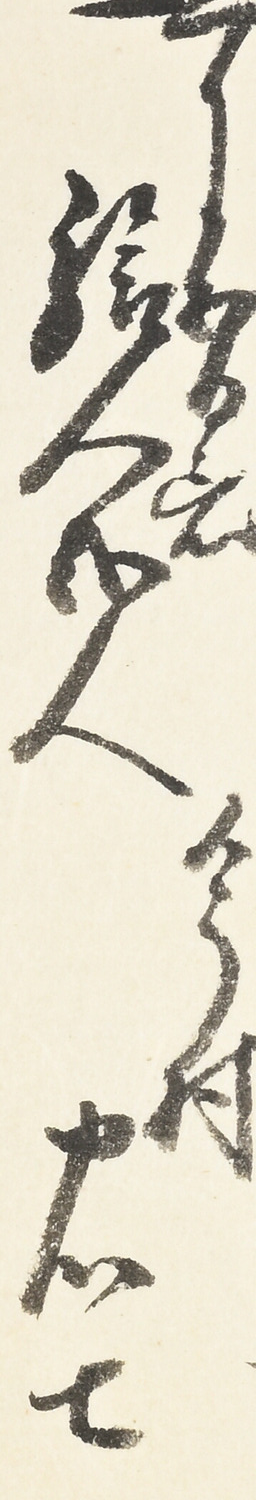一旅人弐人忠七
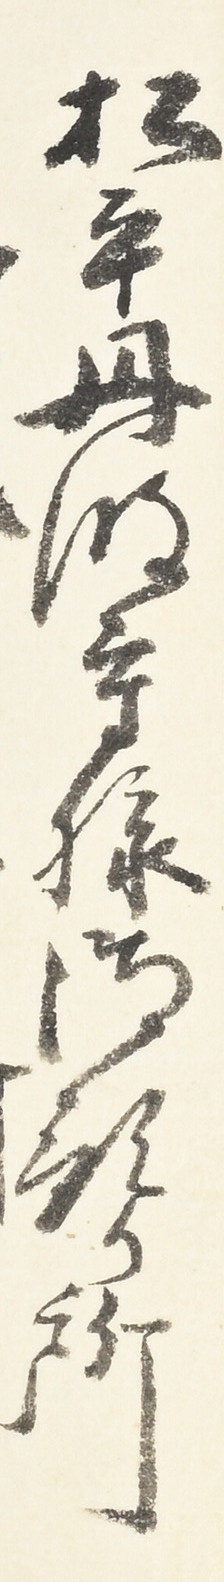松平丹波守様御預リ所
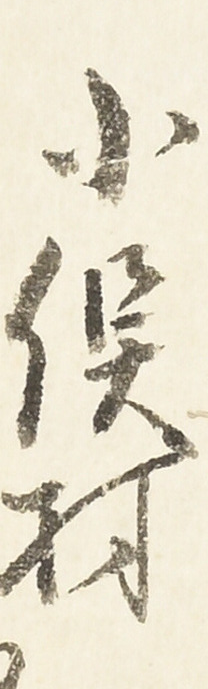小俣村
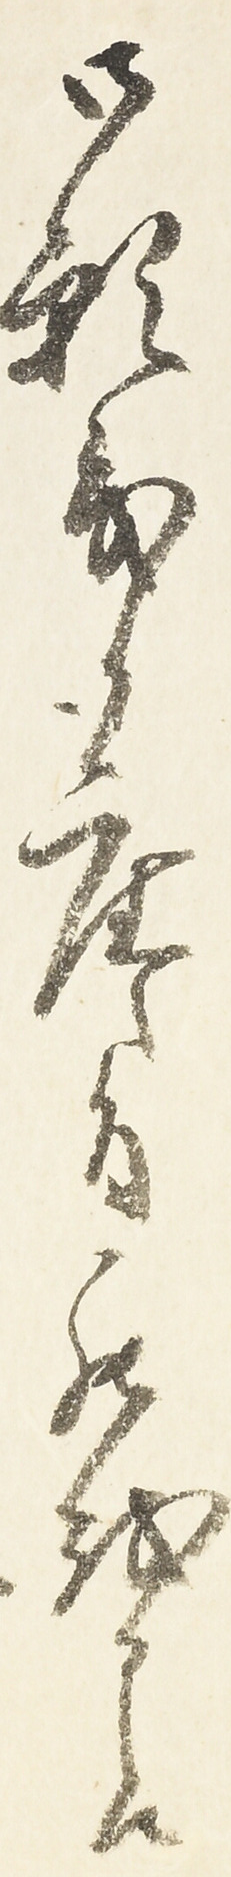御願義御座候付罷越申候
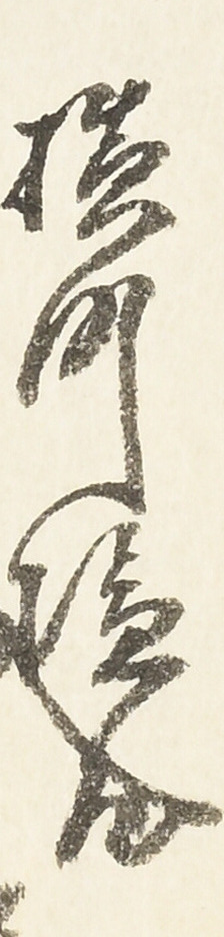横町塩屋
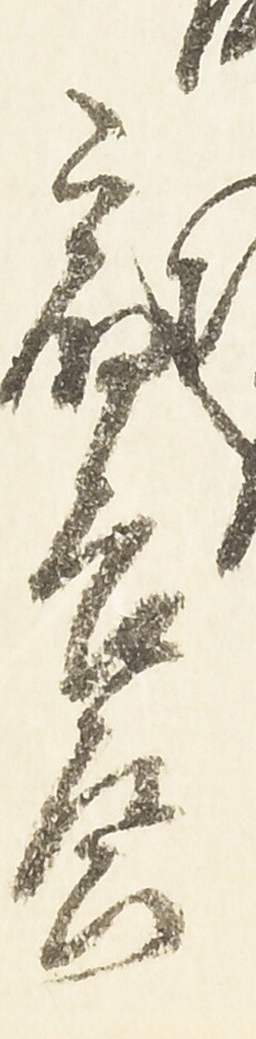宿吉左衛門
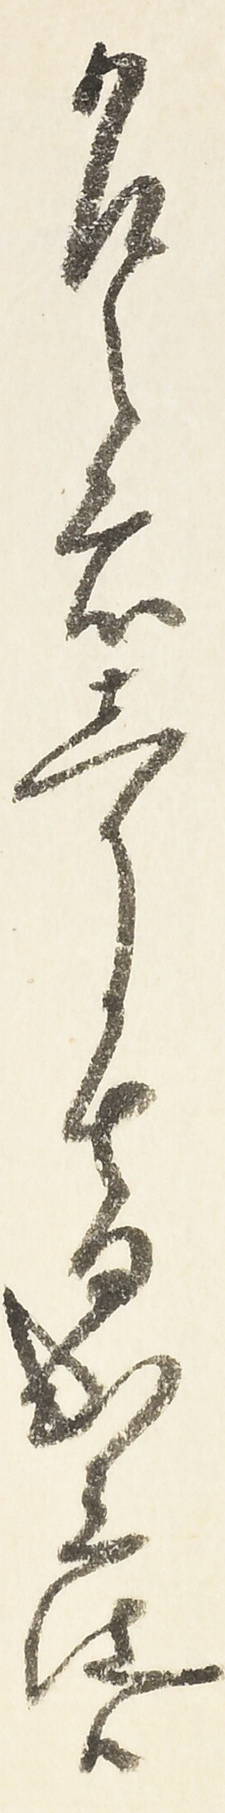右之者十二月七日出立仕候
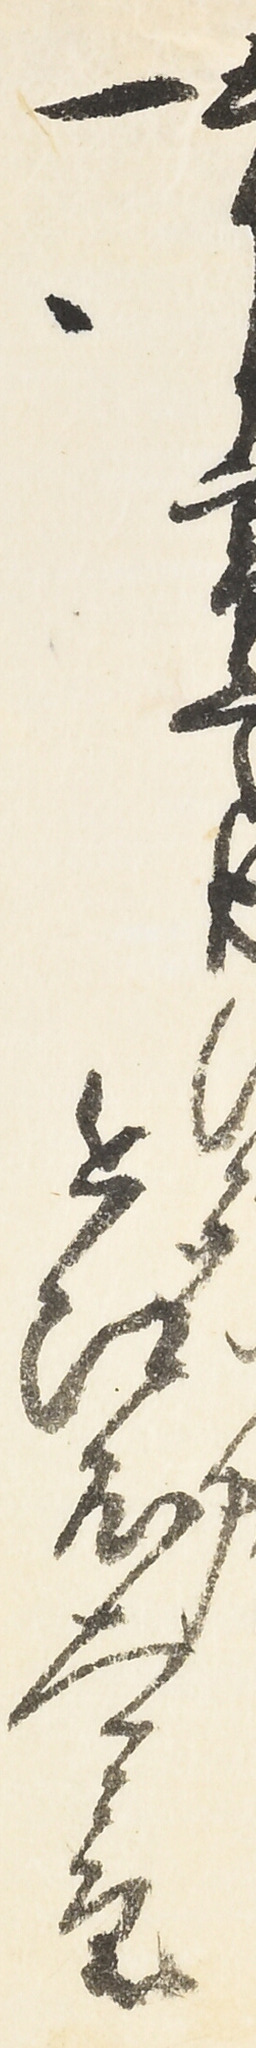一近江屋太兵衛
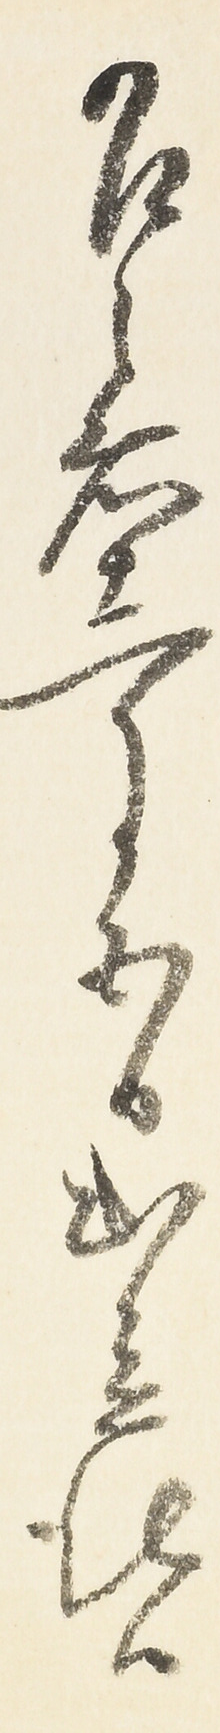右之者十二月五日出立仕候
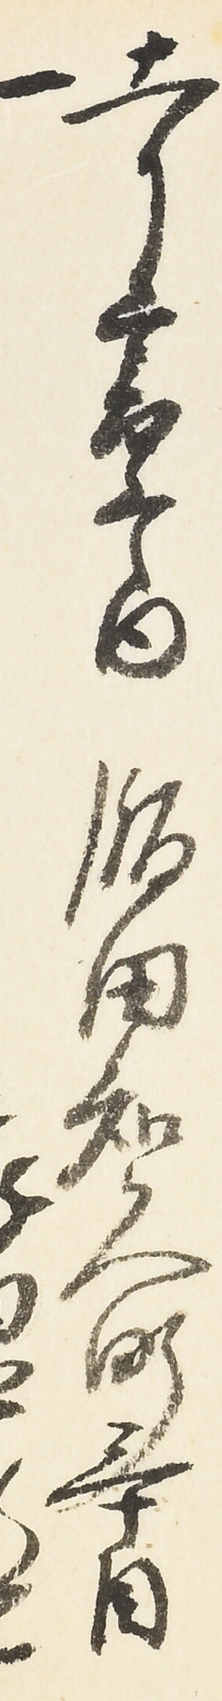十一月書上之内飯田知久町三丁目
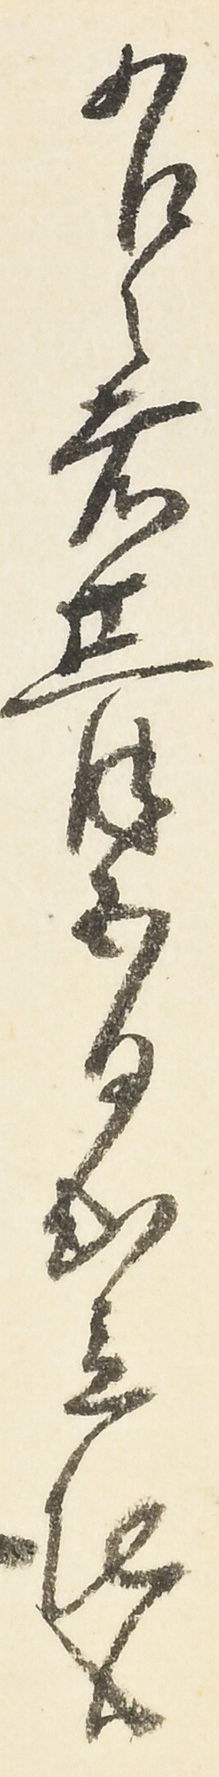右之者十二月五日出立仕候
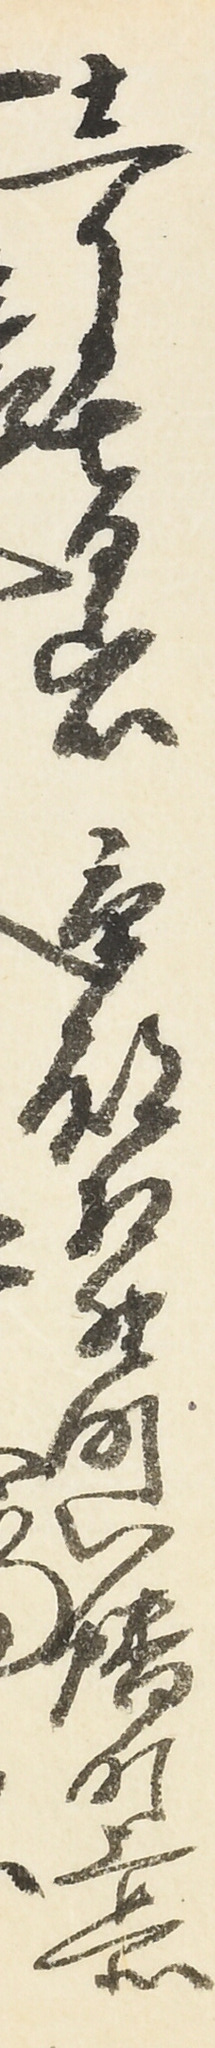十二月七日着京都相野町八幡町上ル所
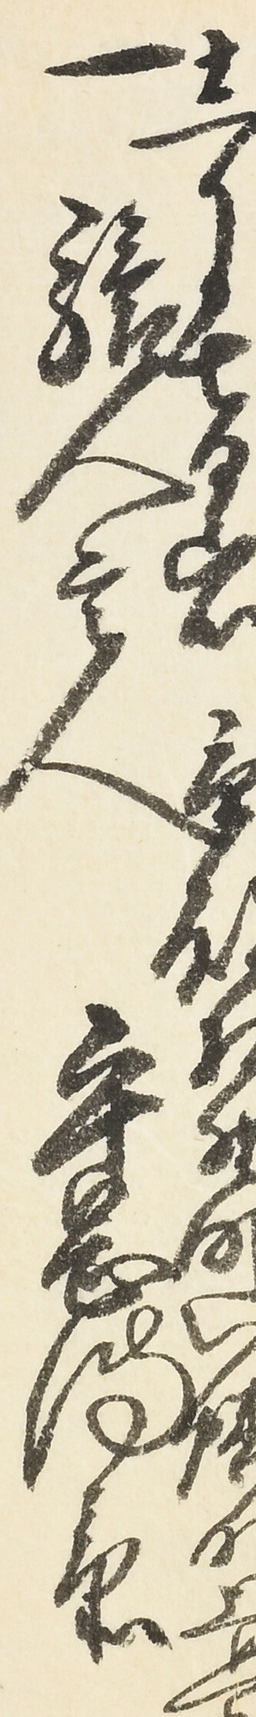一旅人壱人平岡伝兵衛
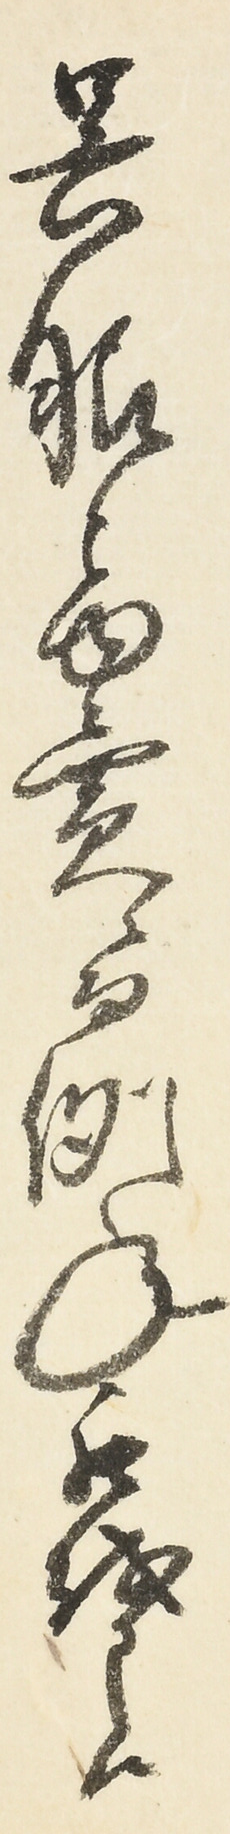呉服商売ニ而例年罷越申候

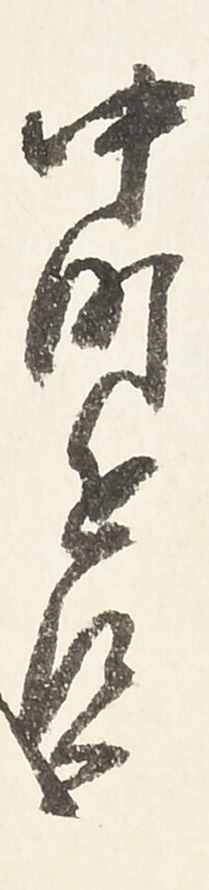中町近江屋
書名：町中旅人泊控帳
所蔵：伊那市立高遠町図書館・合同会社AMANE
